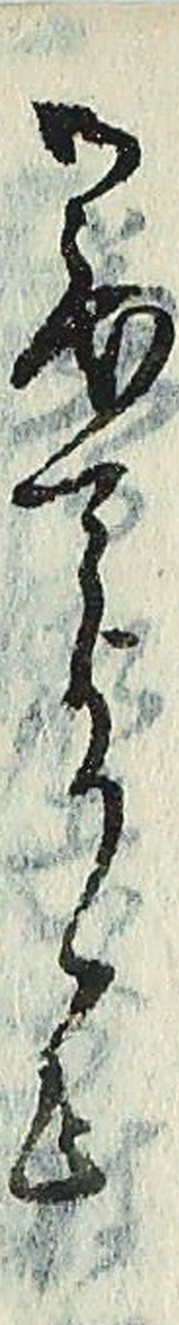御戻可被下候以上
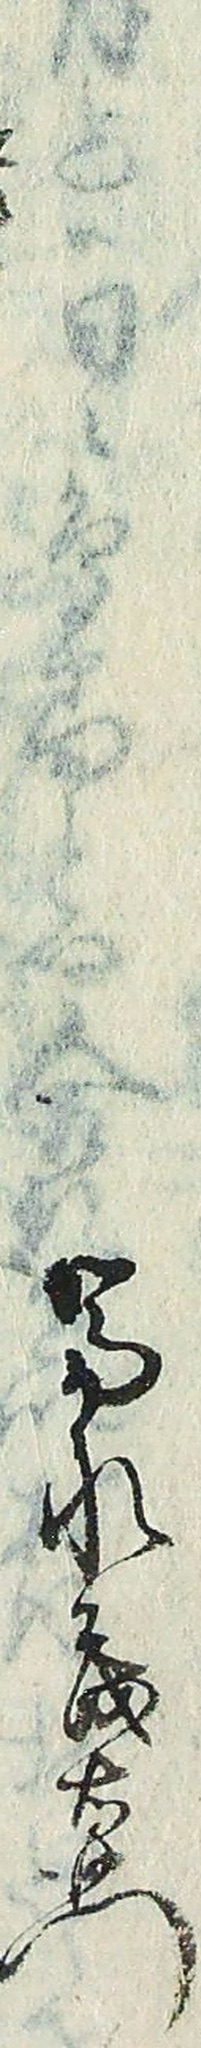富永茂右衛門
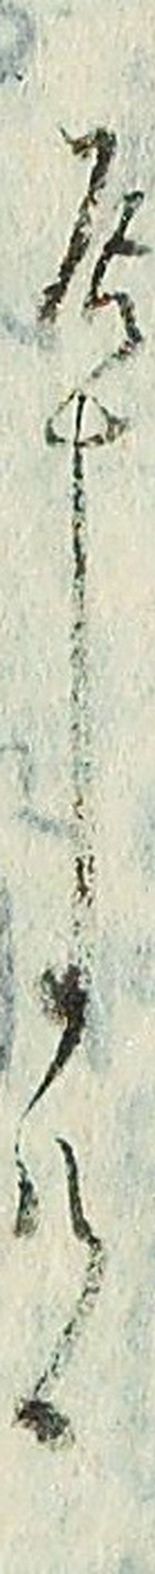辰十月八日
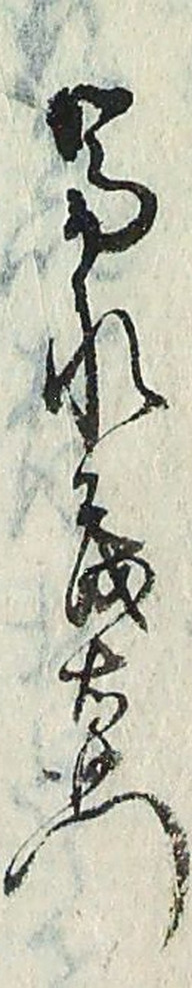富永茂右衛門
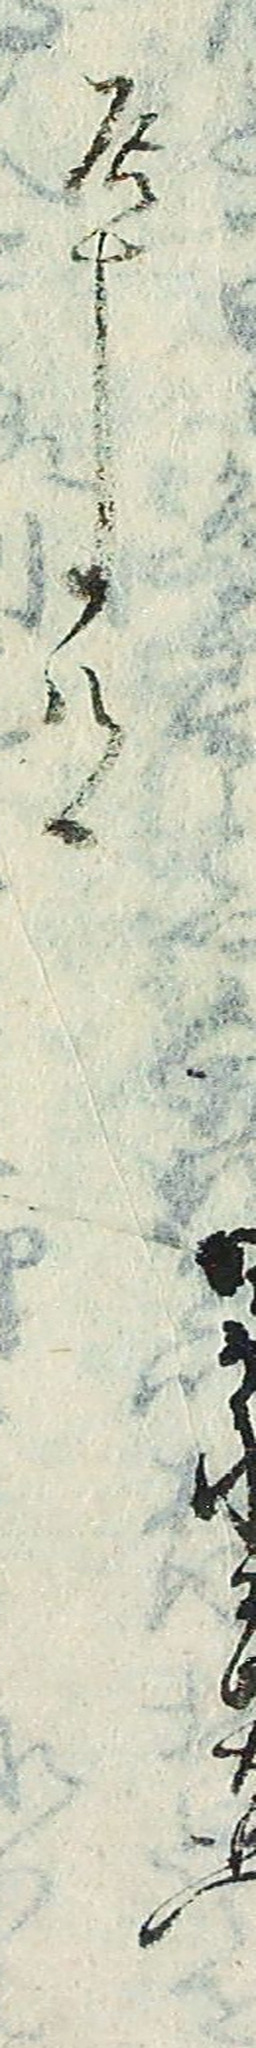辰十月八日
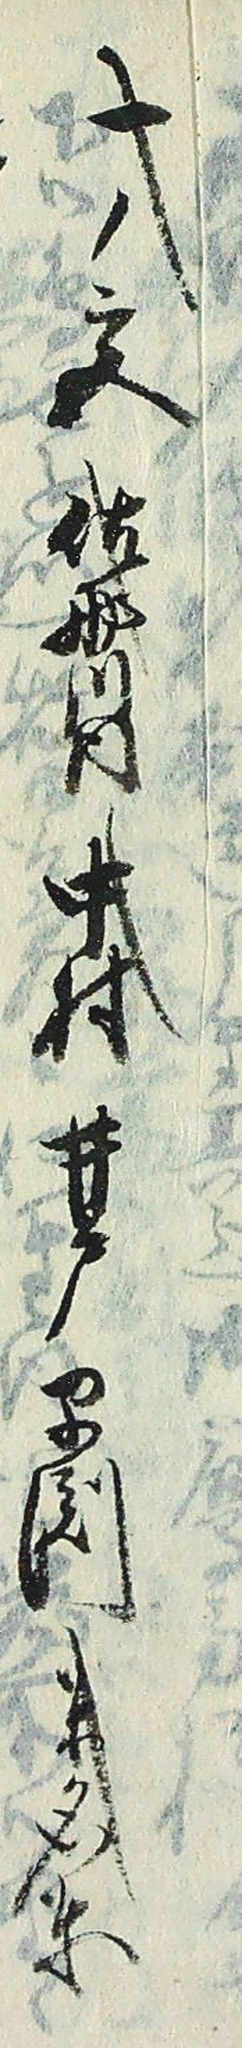一ノ宮佐那川内中村井戸早淵東名東
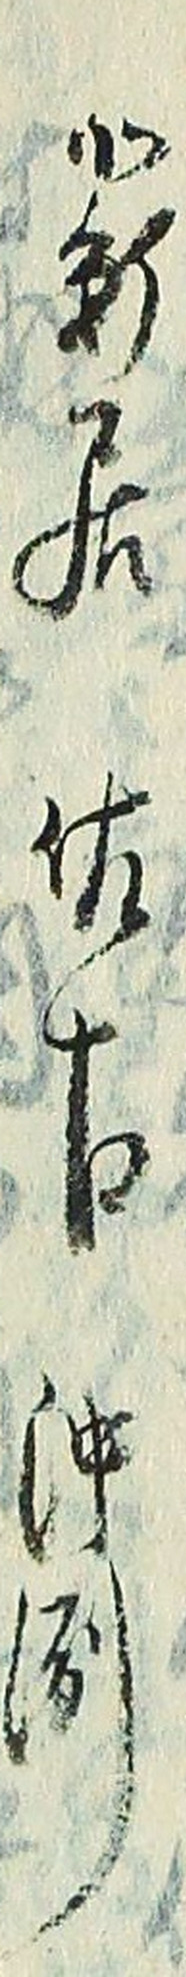北新居佐古沖洲
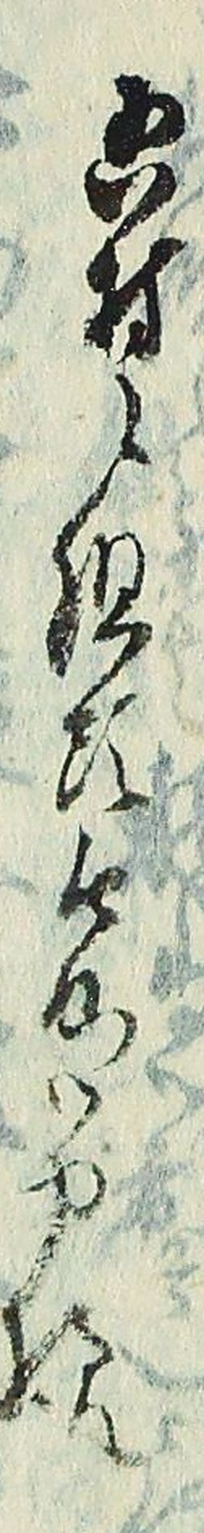右村々組頭庄屋御中様
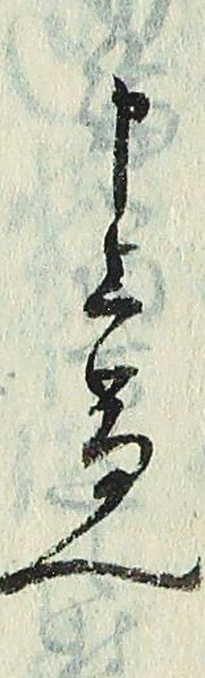申上覚
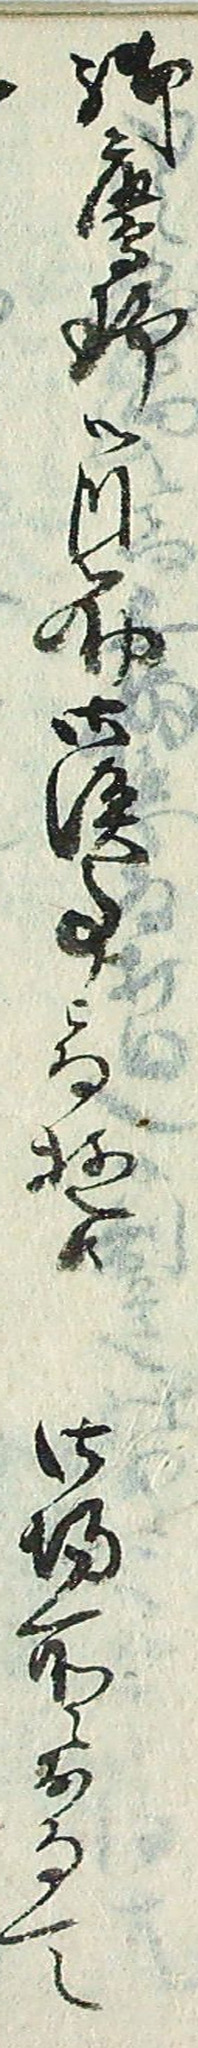御鷹野御川筋御漁事被為遊候御場所におゐて
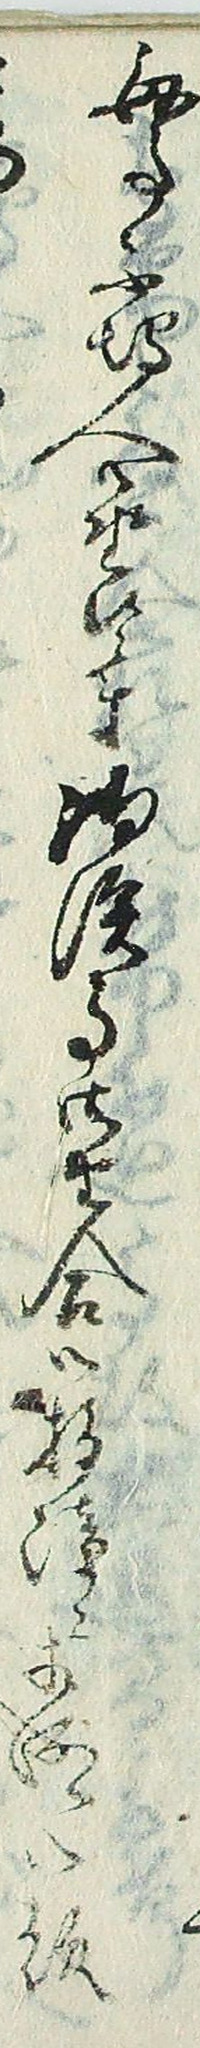毎事不埒人御坐候に付御漁事御野合御指障に相成候御趣
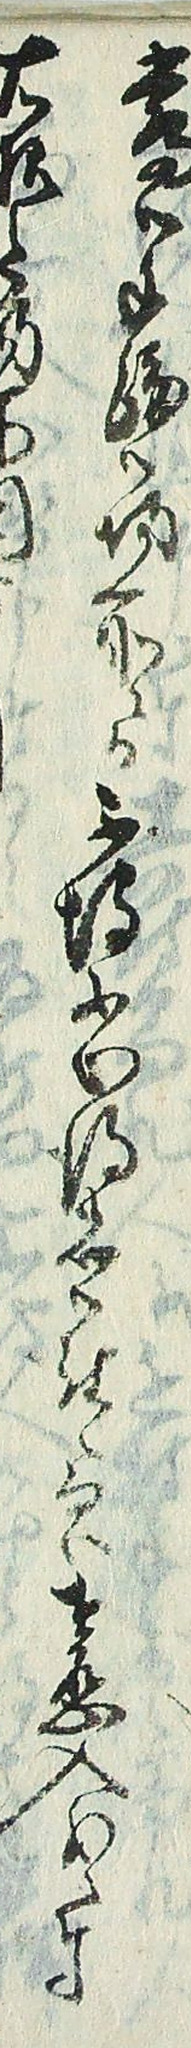当御手崎御場所に而不埒不心得者御座候而は奉恐入義に付
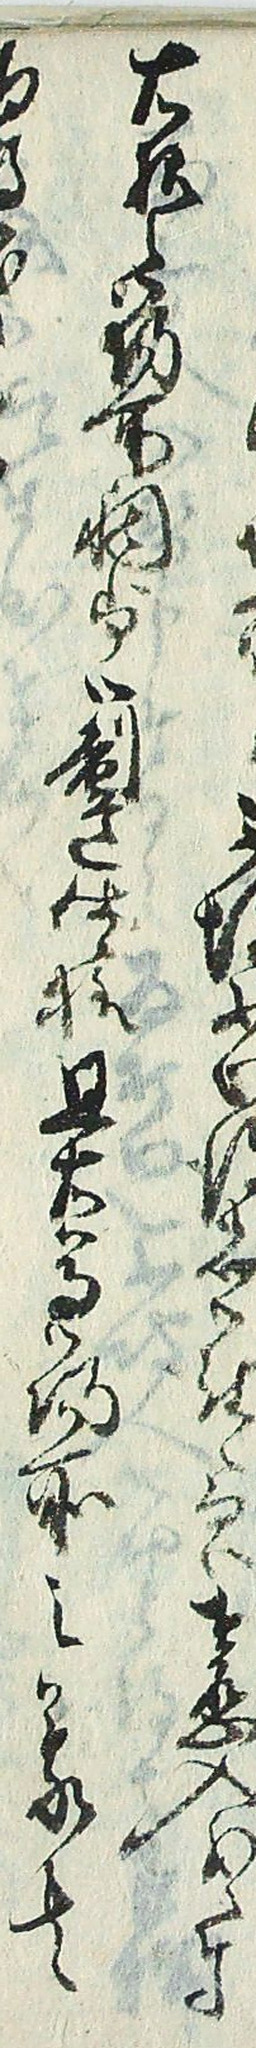右様之御場所稠布御制道仕候様且右等御場所之
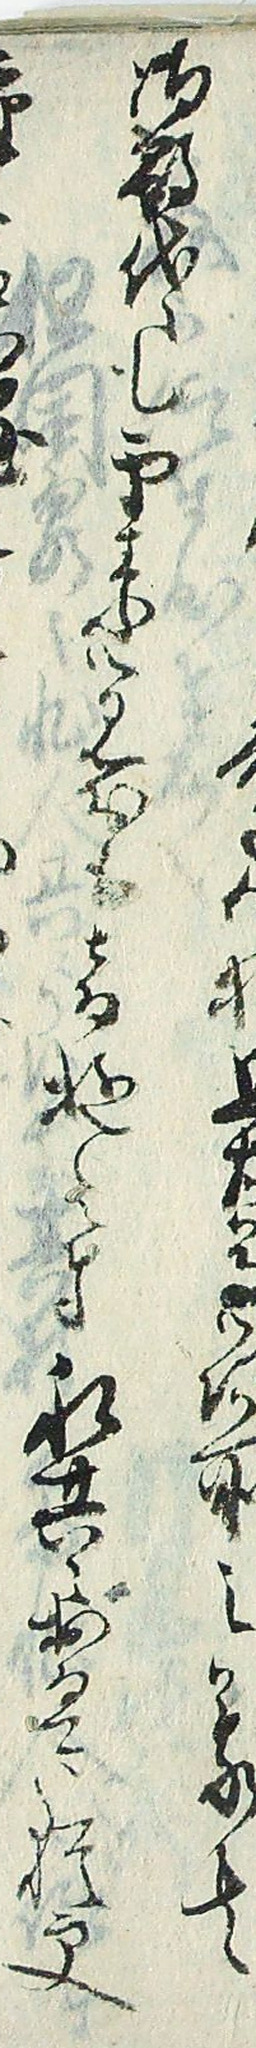御郡代にも平素御見分も被為遊候に付私共におゐては猶更
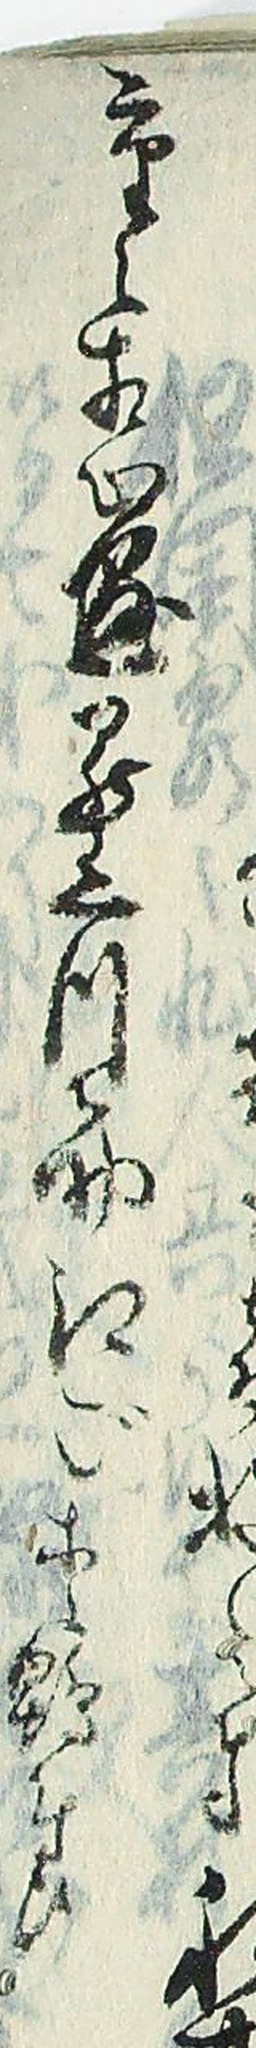重々相心懸罷有川筋えご等に鴨付候

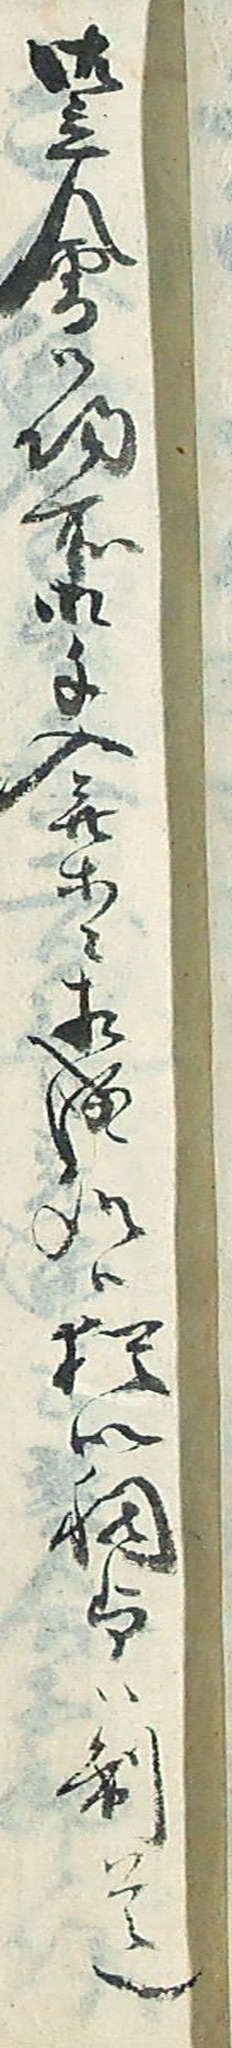御立会御場所御手入幷等に相成候処は猶以稠布
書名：諸御用御□受書控
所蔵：鳴門教育大学 Naruto University of Education
